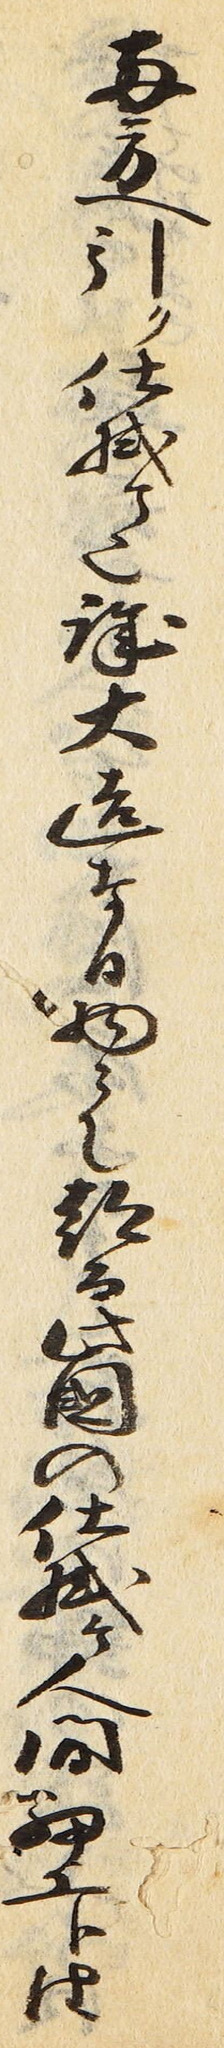両方へ引く仕掛け也誠大造なる物にて都而此国の仕掛ヶ人間細工とは
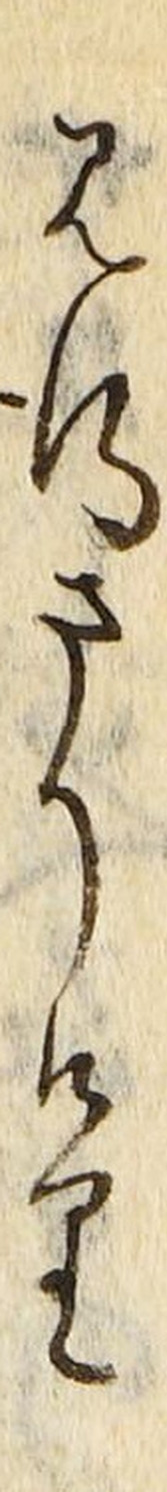見得さりけり
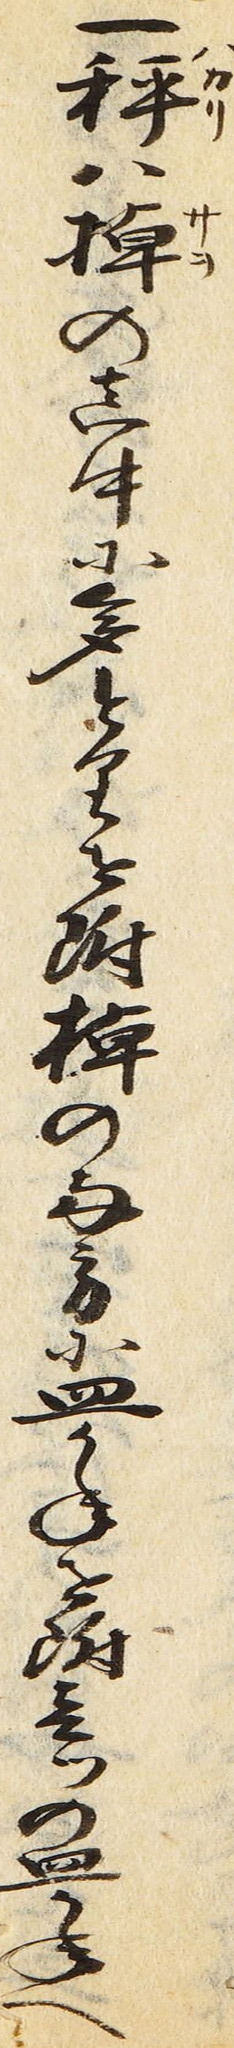一秤は棹の真中にたとりを附棹の両方に皿かねを附壱つの皿かねへ
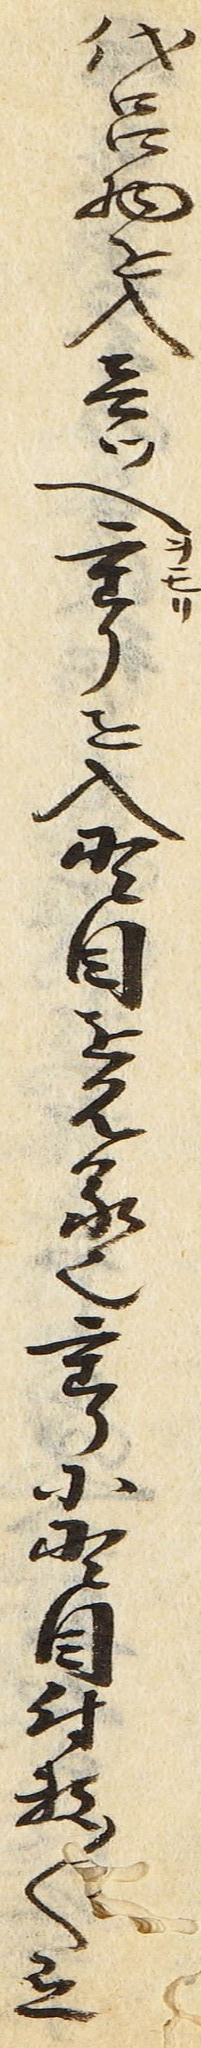代呂物を入壱つへ重りを入貫目を見る也重りに貫目付数〳〵有
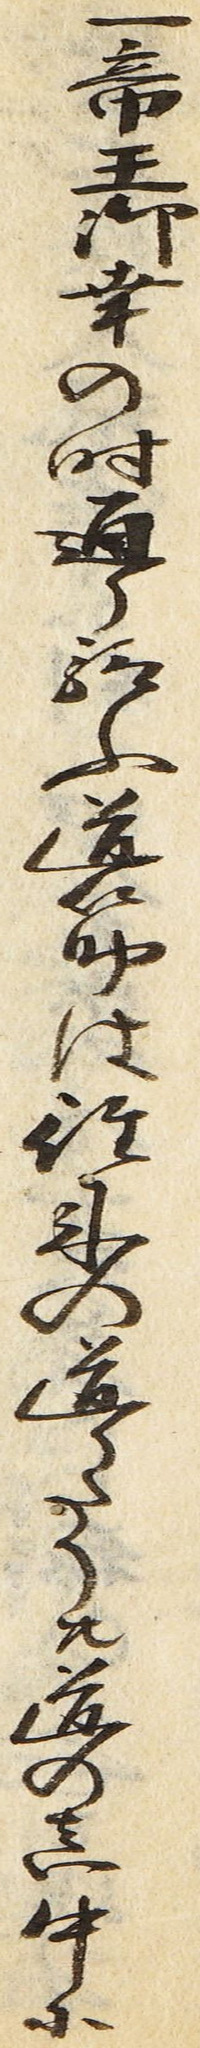一帝王御幸の時通り給ふ道筋は往来の道りたり共道の真中に
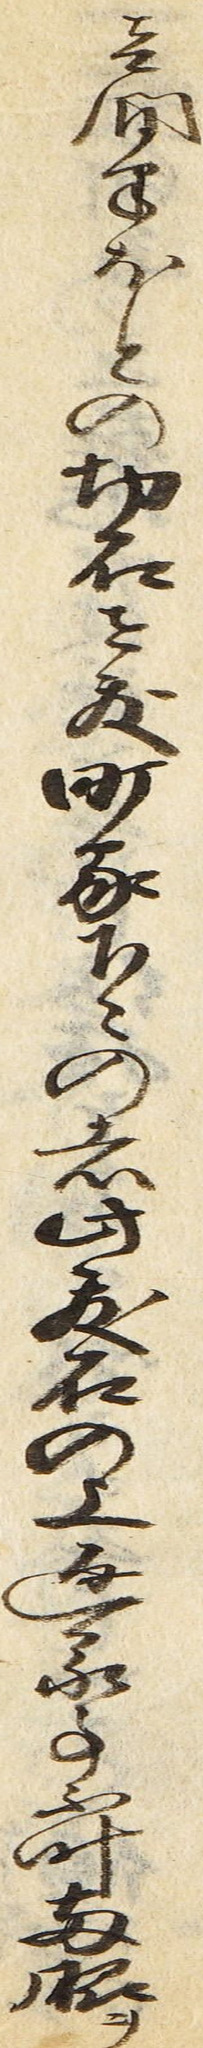壱間半ほとの切石を敷町家下々の者此敷石の上通る事不叶両脇を
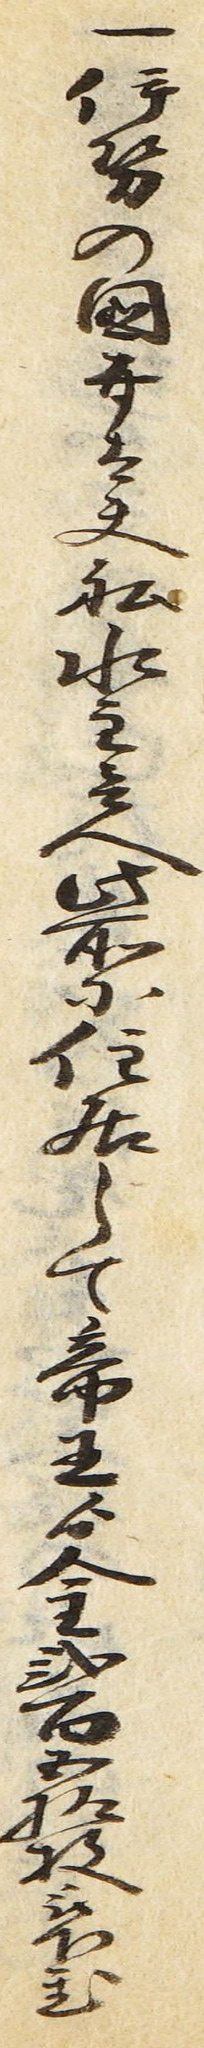一伊勢の国幸太夫船水主壱人此所に住居して帝王ゟ金弐百五拾枚被下置
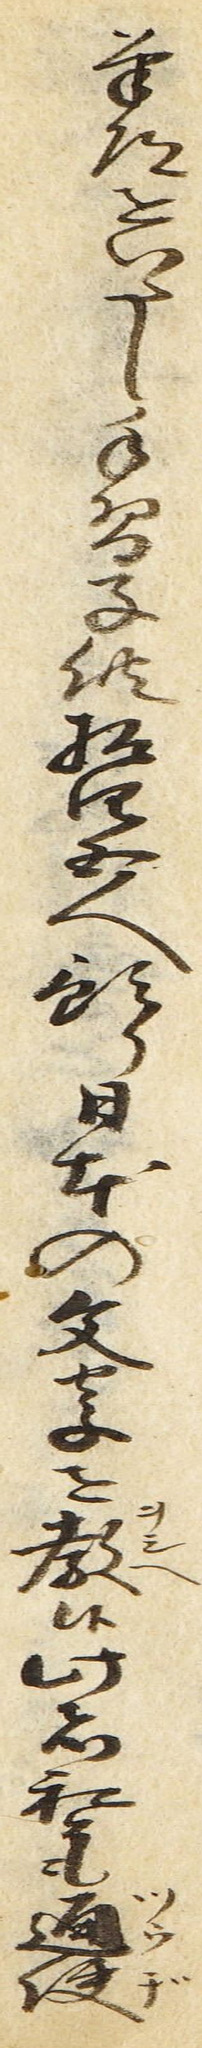筆道をいたし手習子供拾四五人預りに日本の文字を教候此者私とも通使
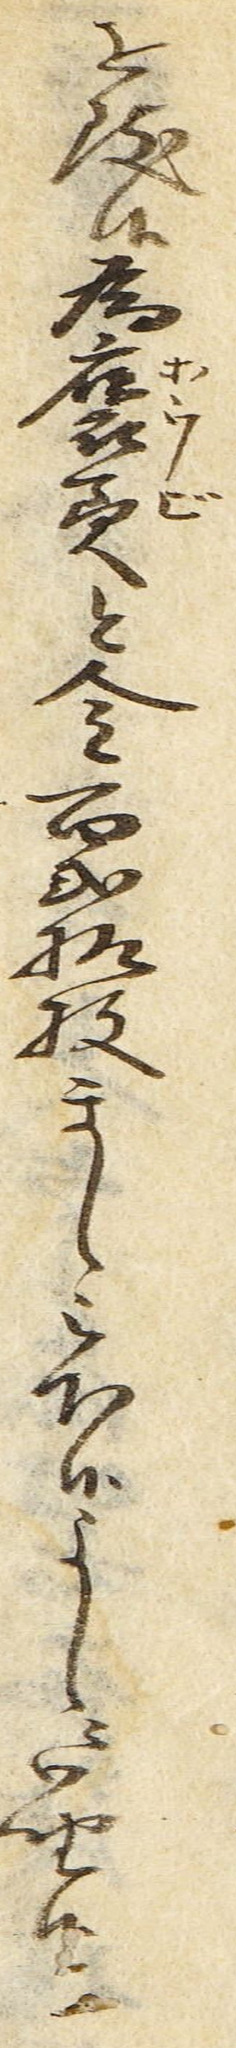を致候為褒美と金百弐拾枚まし被下候よしに御坐候

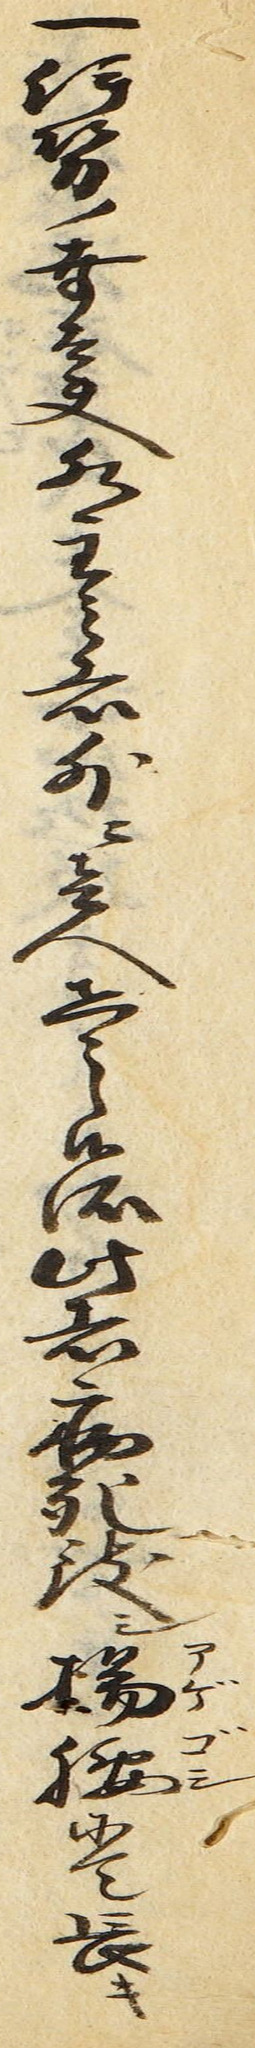一伊勢ノ幸太夫水主之者外に壱人在之候所病死致し揚腰にて長き
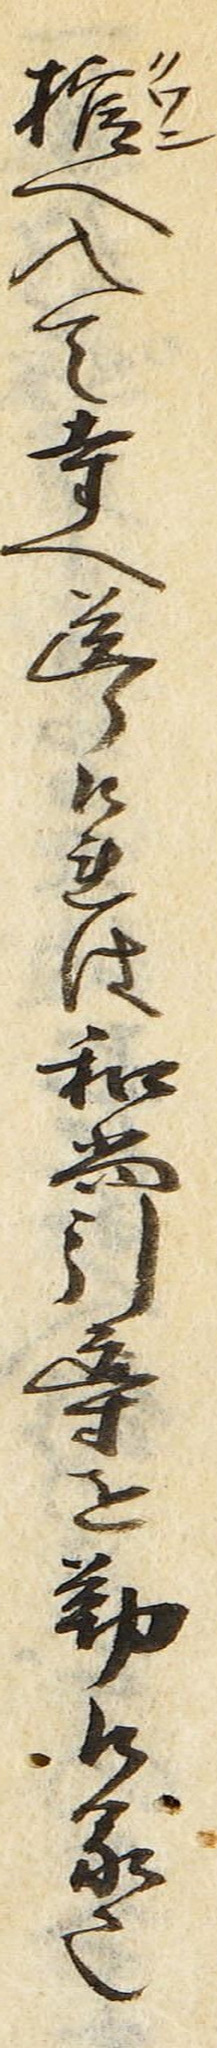棺へ入て寺へ送りけれは和尚引導を勤ける也
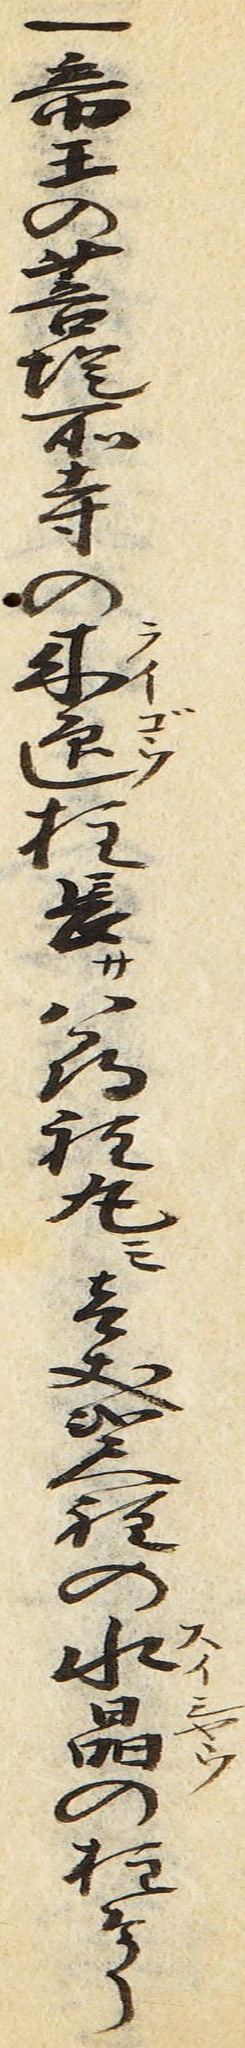一帝王の菩提所寺の来迎柱長さ八尋柱丸み壱丈弐尺程の水晶の柱なり
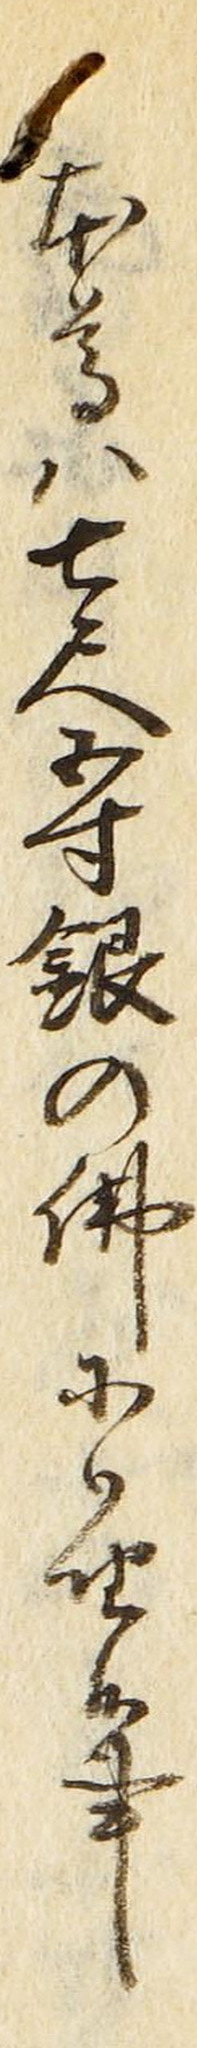本尊は七尺五寸銀の仏に御座候事
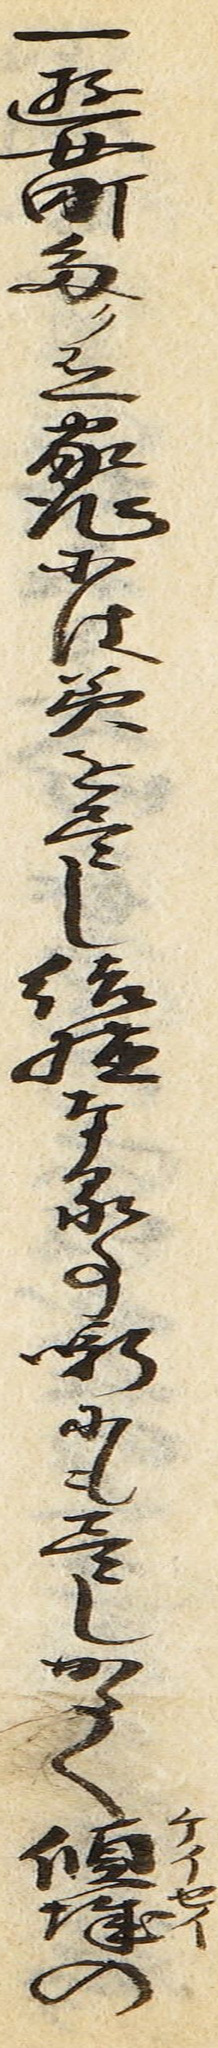一遊女町多く有家作には美を尽し結構なる事噺にも尽しかたく傾城の
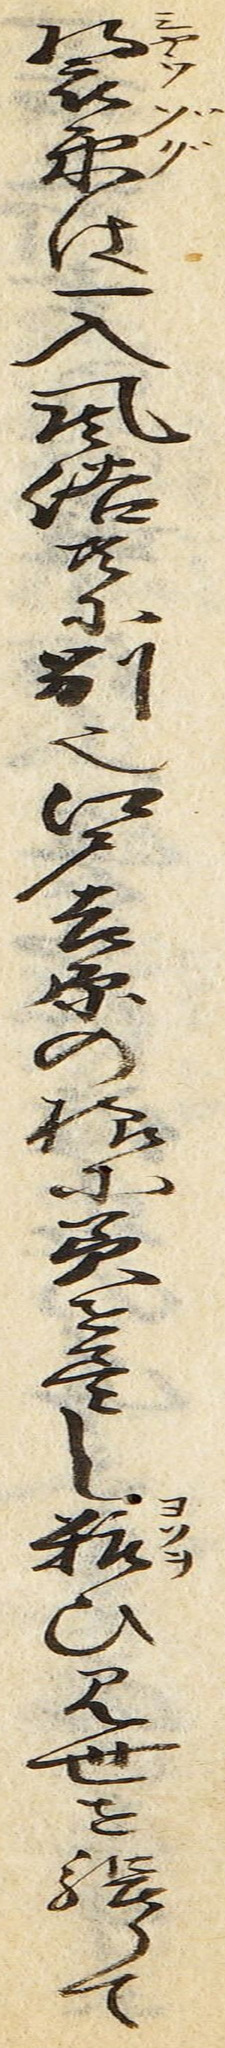装束は一入風俗共に別也江戸吉原の様に美を尽し粧ひ見世を張りて
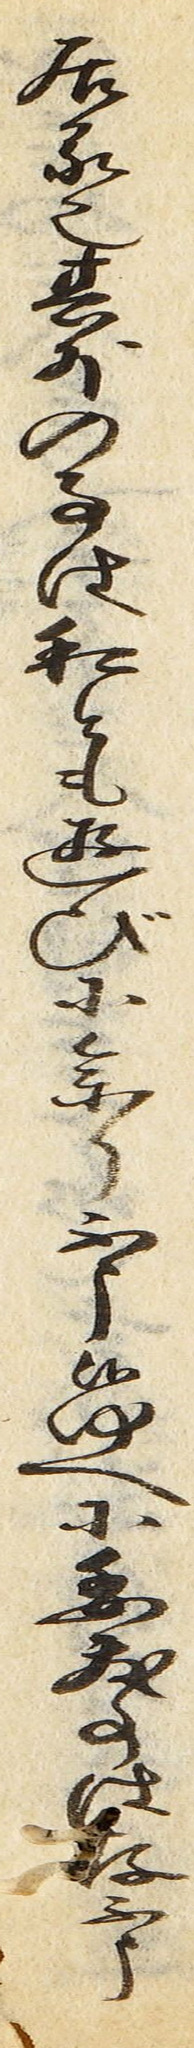居る也其外の事は私とも遊びに集り不申候ゆへに委敷事は存不申
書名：外国漂流記
